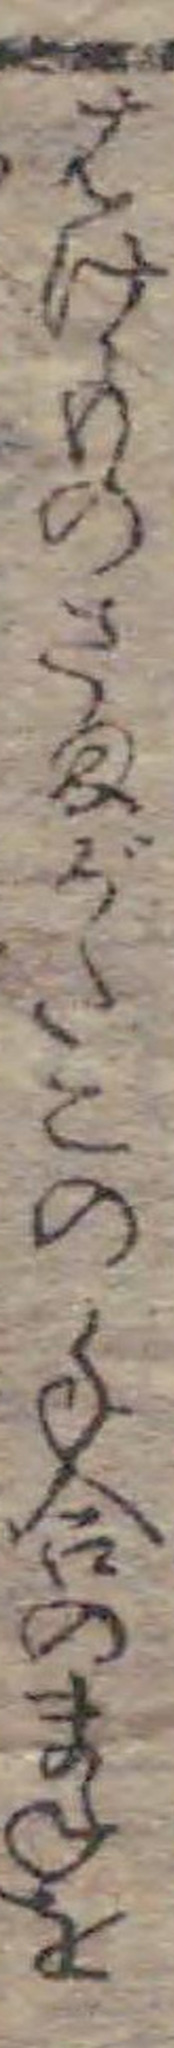はけものさまがたこの手合のねを
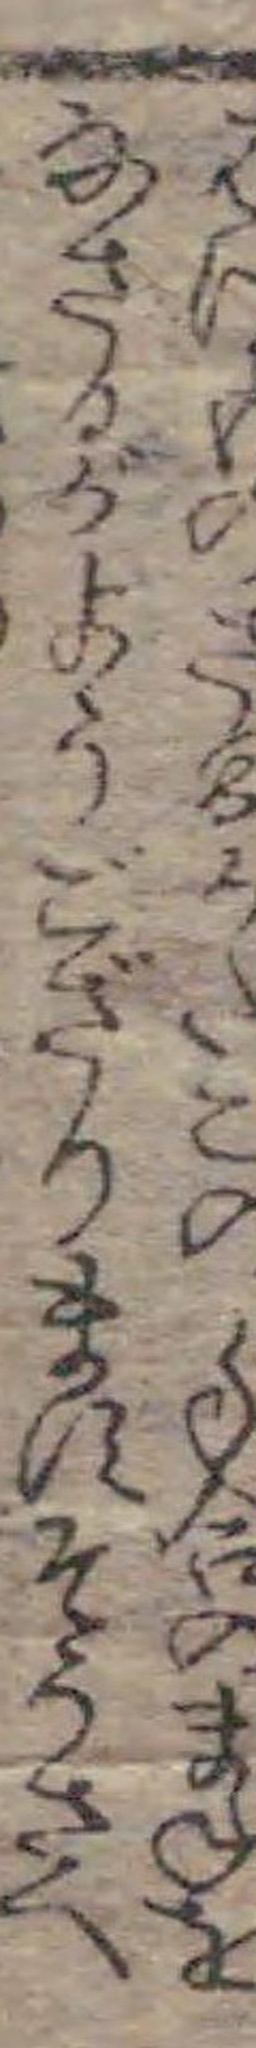なさるがようござりますそうさへ
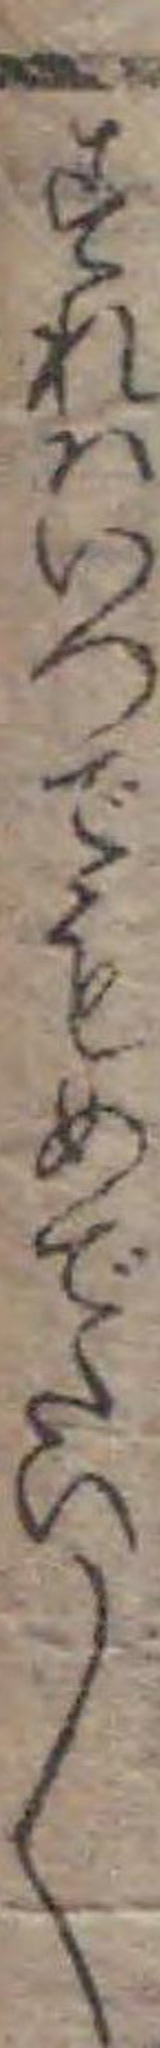すれはいつでもめでたい〳〵
